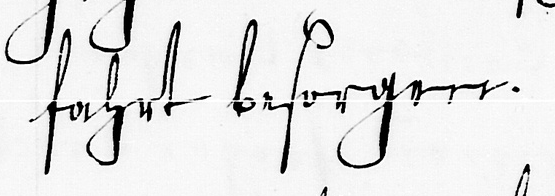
fahrt besorgen.
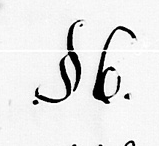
§. 6.
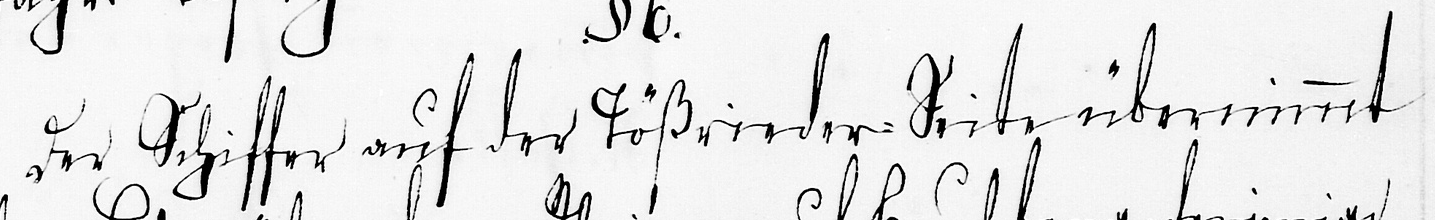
Der Schiffer auf der Tößrieder-Seite übernimmt
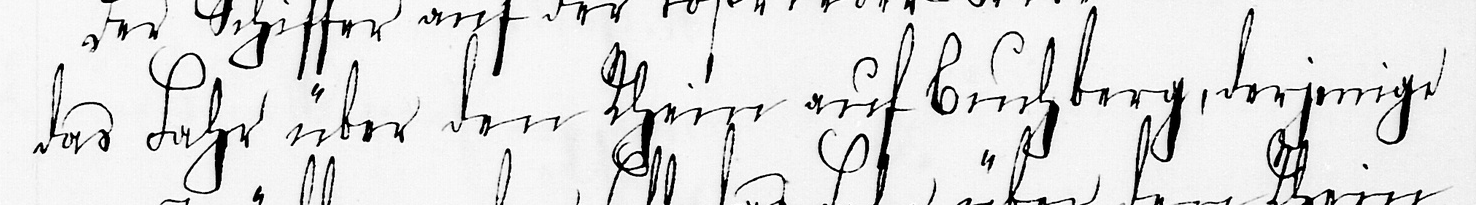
das Fahr über den Rhein auf Buchberg, derjenige
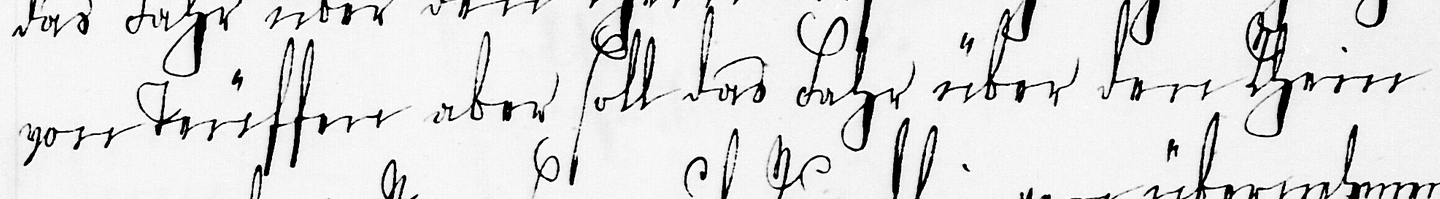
von Teuffen aber soll das Fahr über den Rhein
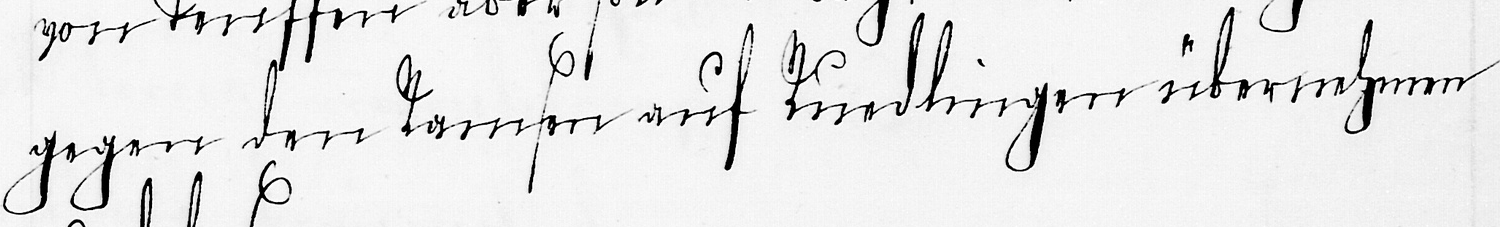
gegen den Ramsen auf Ruedlingen übernehmen
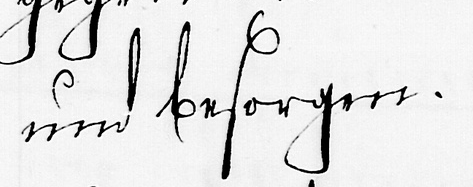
und besorgen.
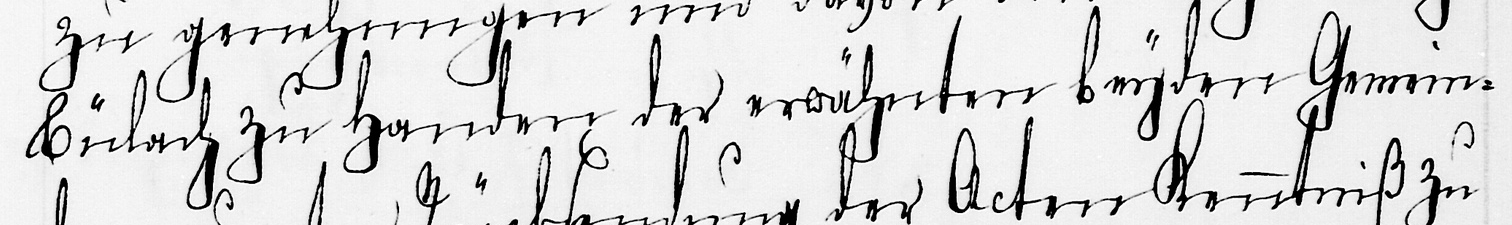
Bülach zu Handen der erwähnten beyden Gemein¬
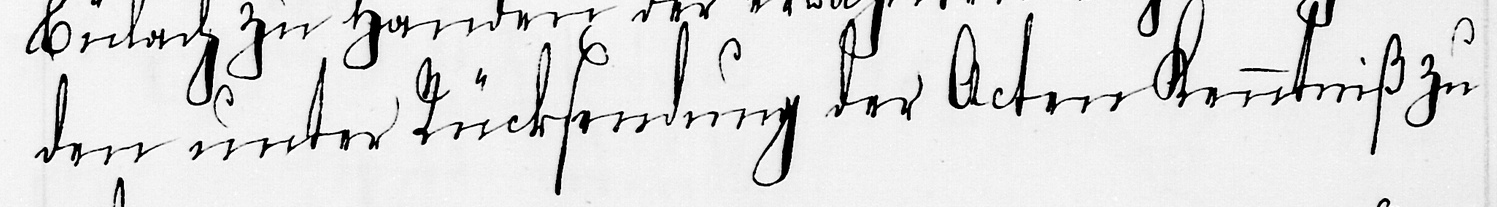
den unter Rücksendung der Acten Kenntniß zu
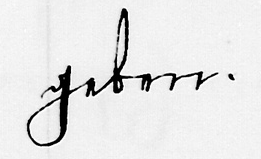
geben.
